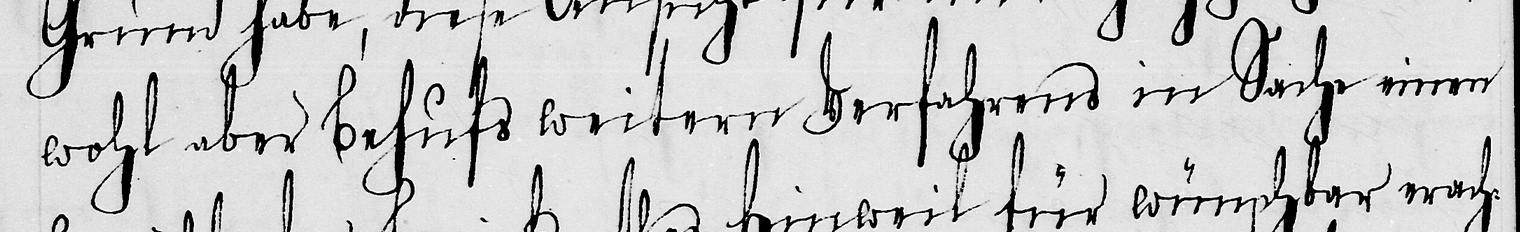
wohl aber Behufs weitern Verfahrens in Sache einen
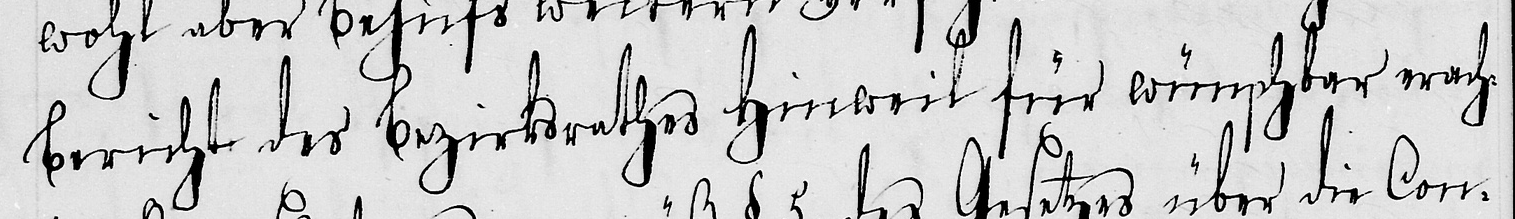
Bericht des Bezirksrathes Hinweil für wünschbar erach¬
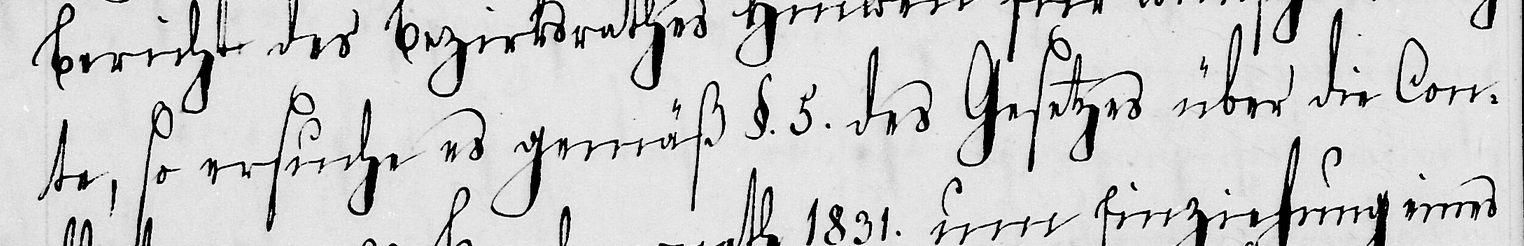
te, so ersuche es gemäß §. 5. des Gesetzes über die Con¬
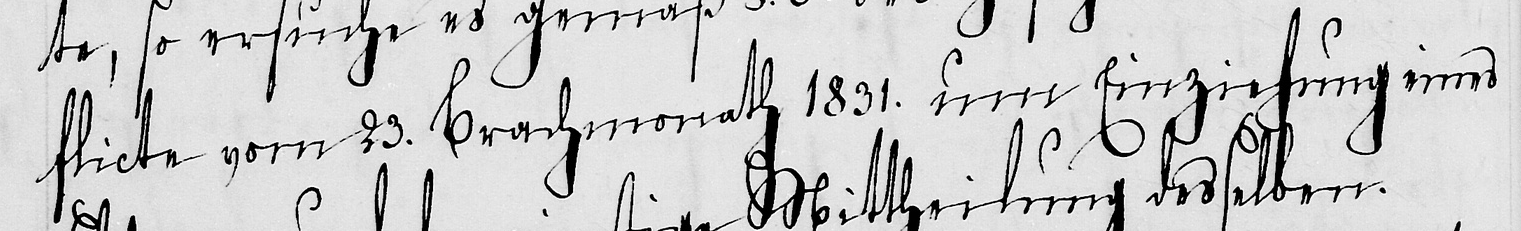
flicte vom 23. Brachmonath 1831. um Einziehung eines
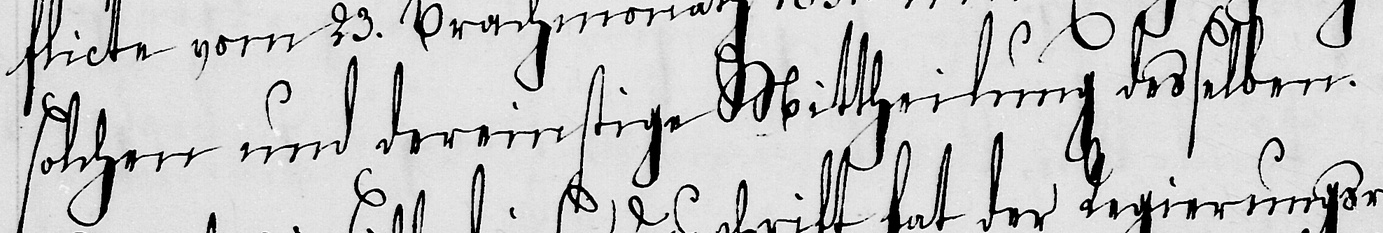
solchen und dereinstige Mittheilung desselben.
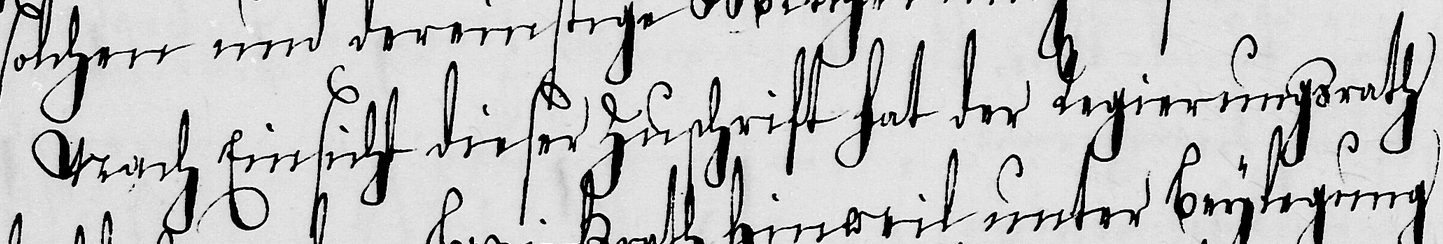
Nach Einsicht dieser Zuschrift hat der Regierungsrath
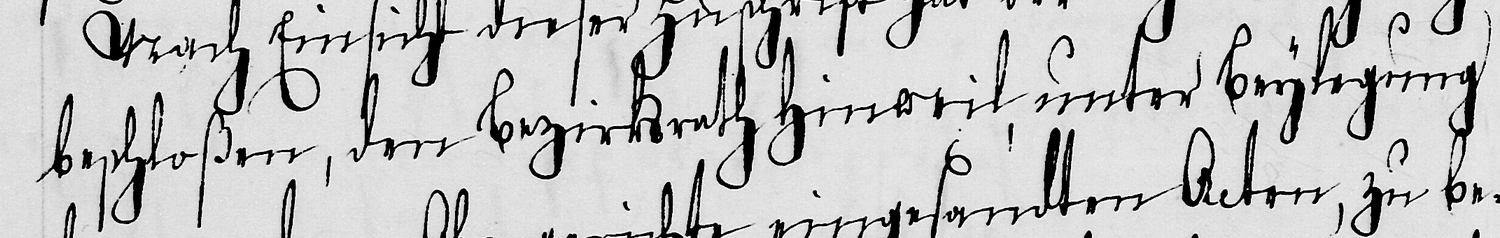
beschloßen, den Bezirksrath Hinweil, unter Beylegung
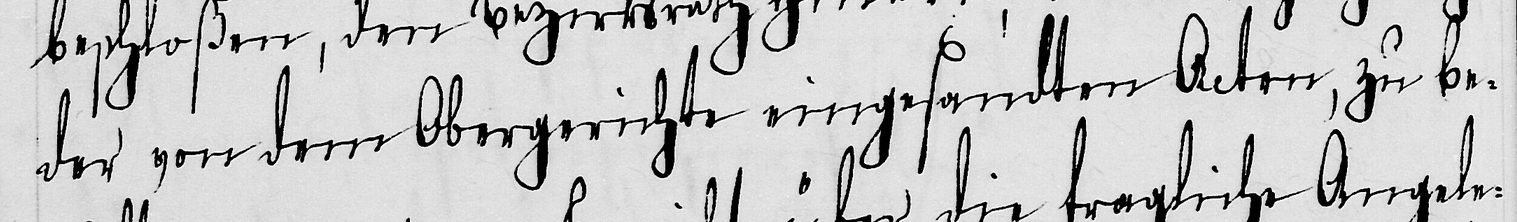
der von dem Obergerichte eingesandten Acten, zu be¬
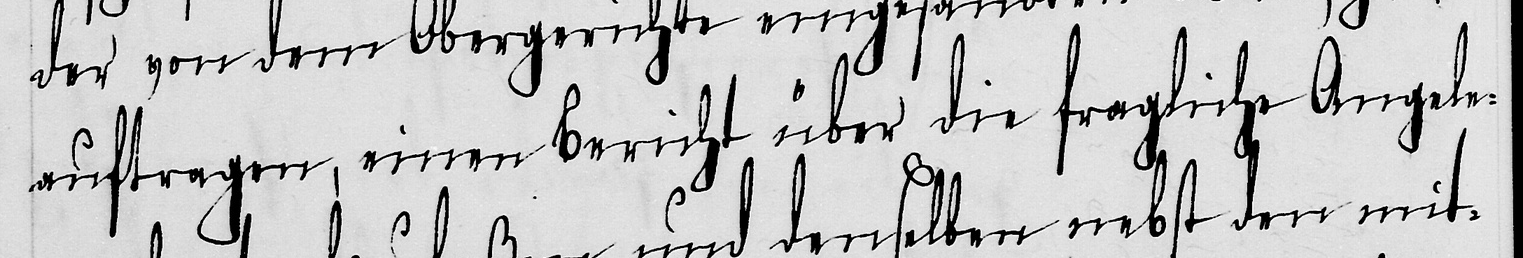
auftragen, einen Bericht über die fragliche Angele¬
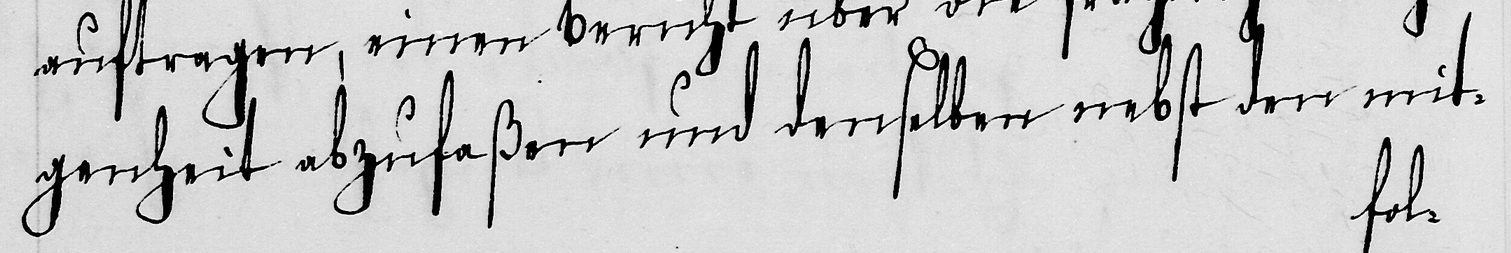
genheit abzufaßen und denselben nebst den mit-
